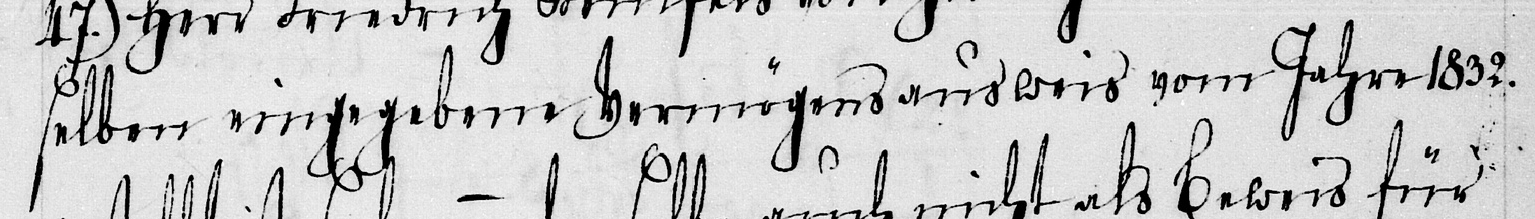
selben eingegebene Vermögensausweis vom Jahre 1832.
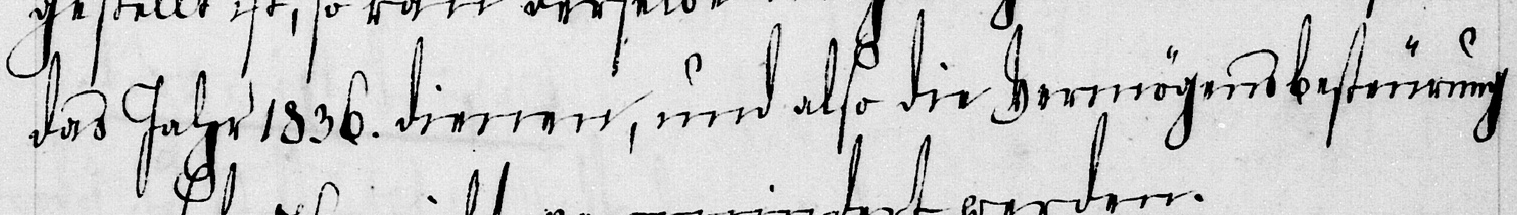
das Jahr 1836. dienen, und also die Vermögensbesteuerung
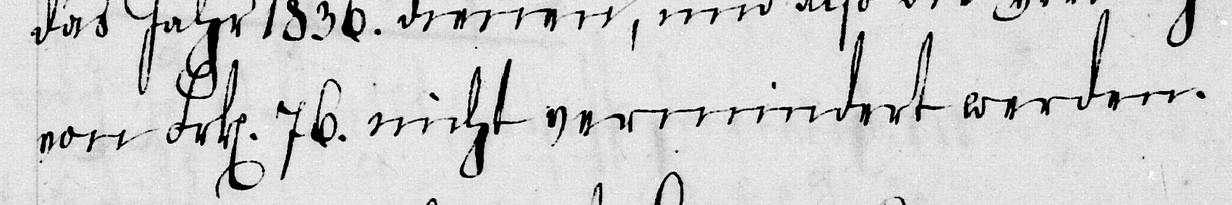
von Frk[en]. 76. nicht vermindert werden.
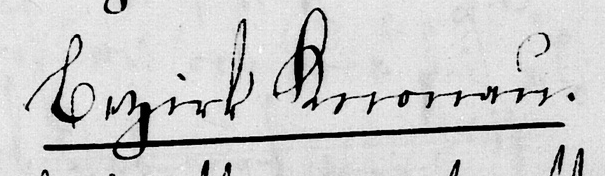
Bezirk Knonau.
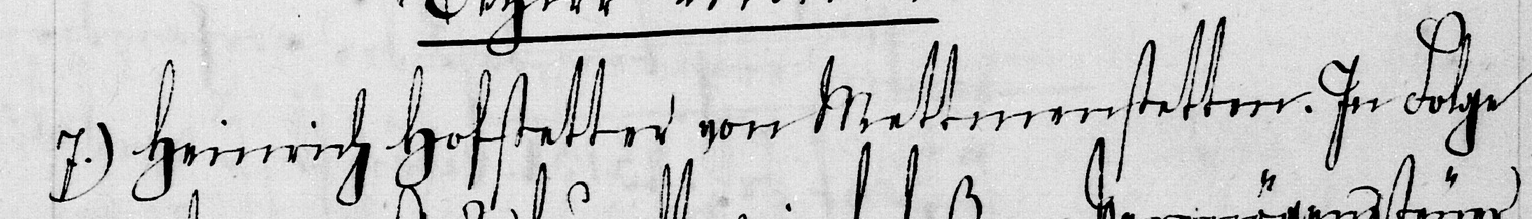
7.) Heinrich Hofstetter von Mattmenstetten. In Folge
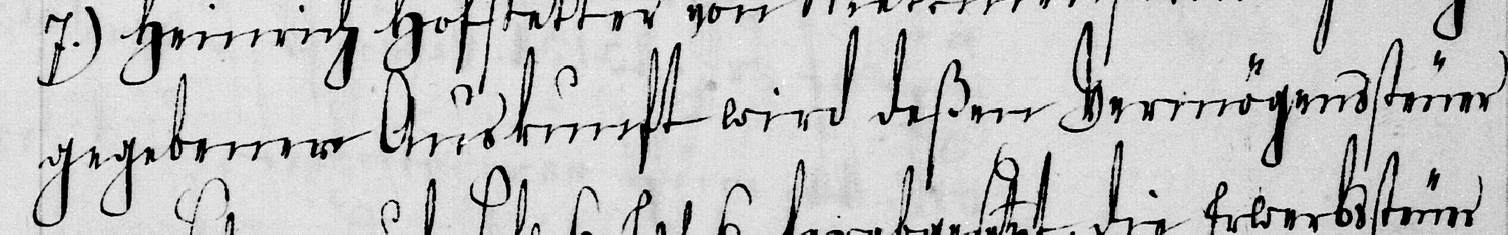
gegebener Auskunft wird deßen Vermögenssteuer
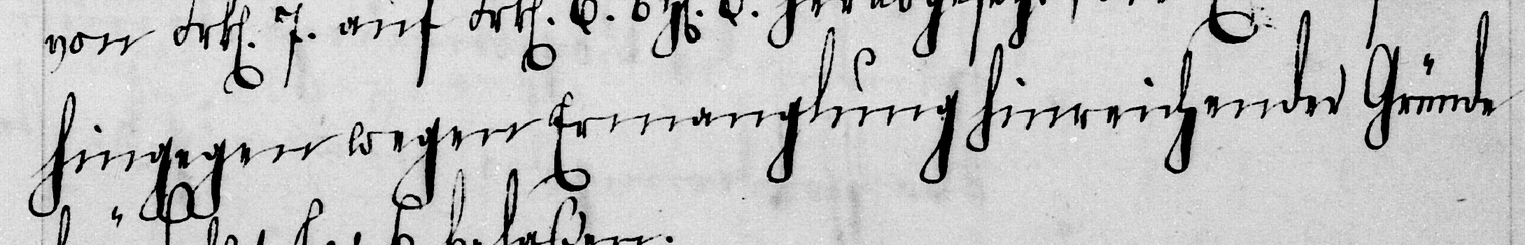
hingegen wegen Ermanglung hinreichender Gründe
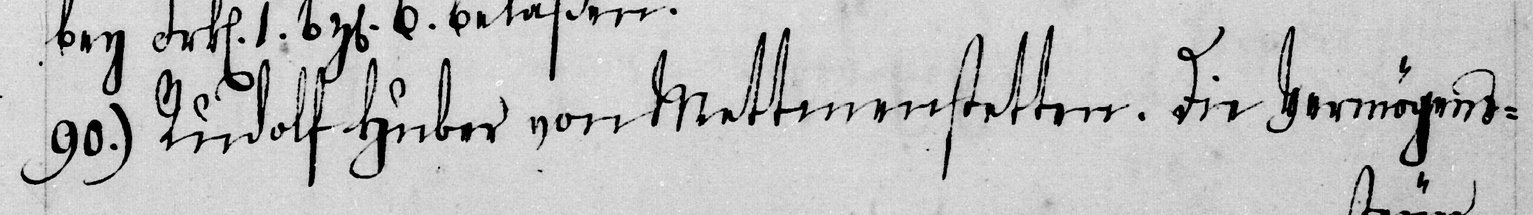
90.) Rudolf Huber von Mettmenstetten. Die Vermögens-
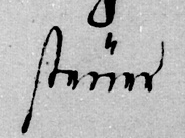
steuer
